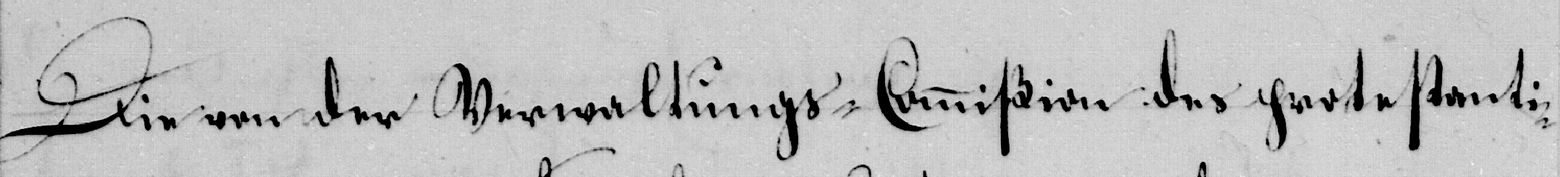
Die von der Verwaltungs-Commißion des protestanti¬
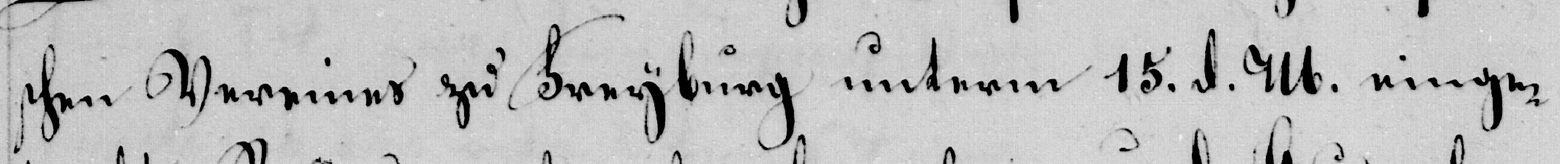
schen Vereines zu Freyburg unterm 15. d. M. einge¬
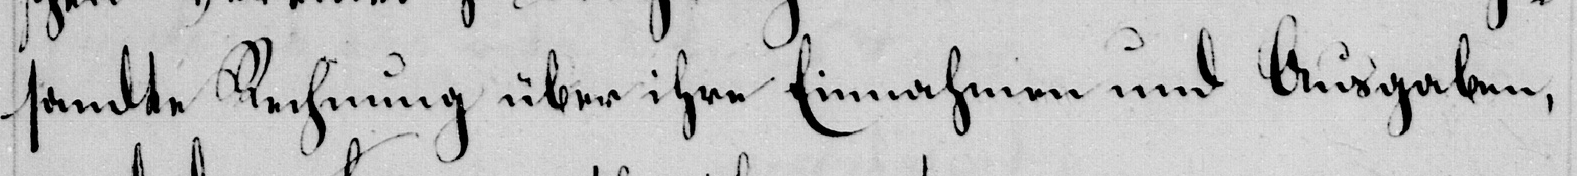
sandte Rechnung über ihre Einnahmen und Ausgaben,
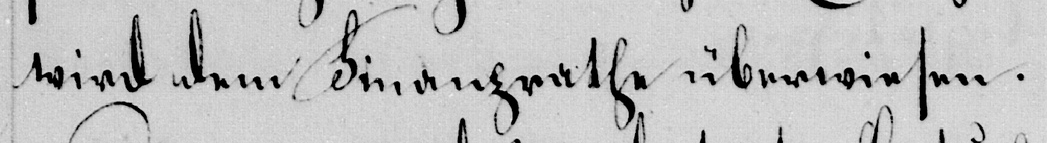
wird dem Finanzrathe überwiesen.
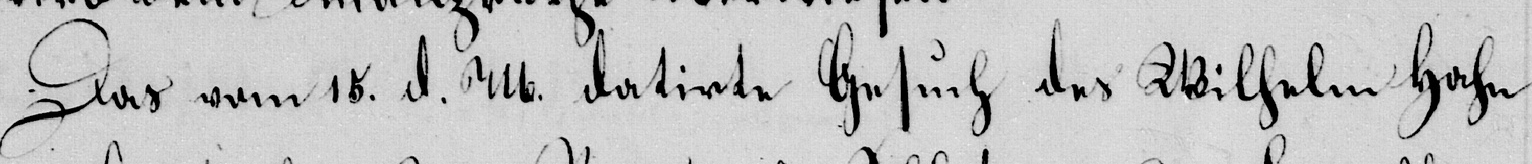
Das vom 15. d. M. datirte Gesuch des Wilhelm Hahn
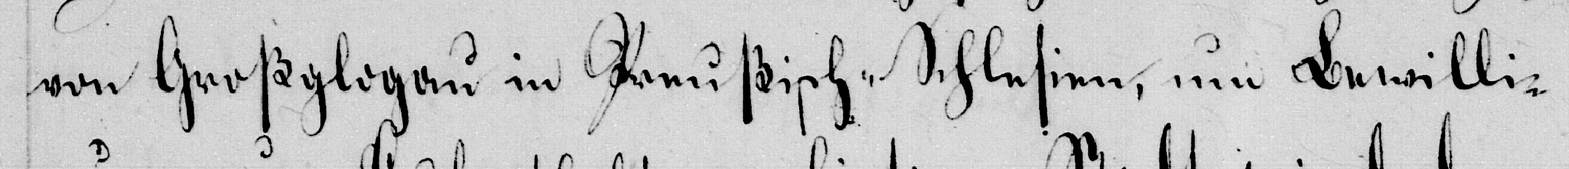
von Großglogau in Preußisch-Schlesien, um Bewilli¬
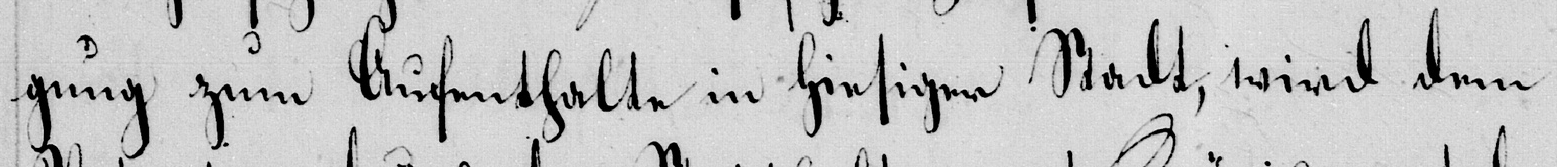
gung zum Aufenthalte in hiesiger Stadt, wird dem
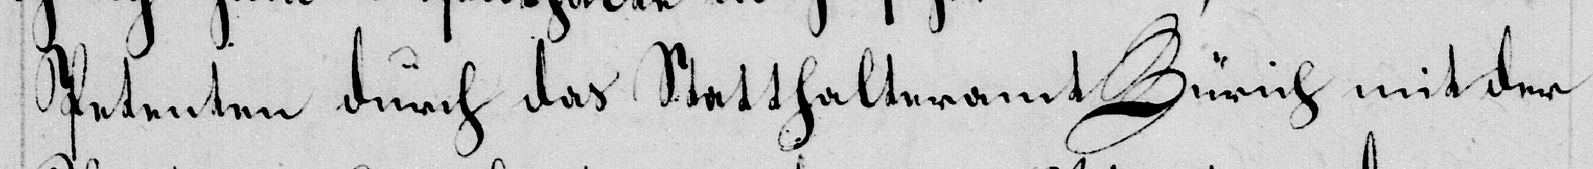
Petenten durch das Statthalteramt Zürich mit der
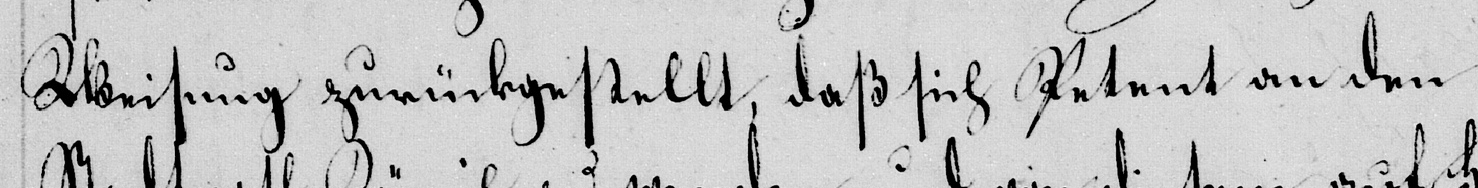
Weisung zurückgestellt, daß sich Petent an den
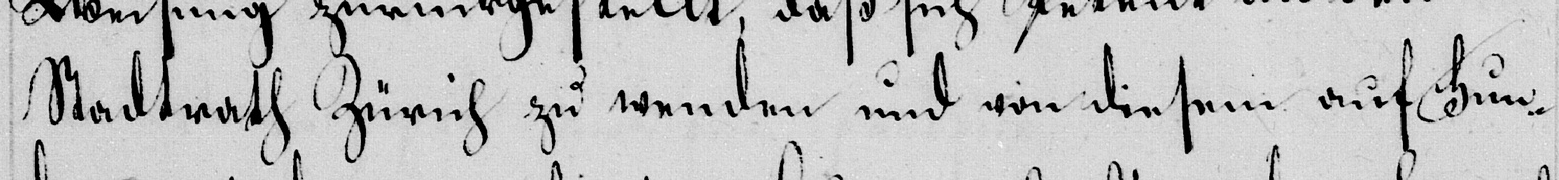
Stadtrath Zürich zu wenden und von diesem auf Fun¬
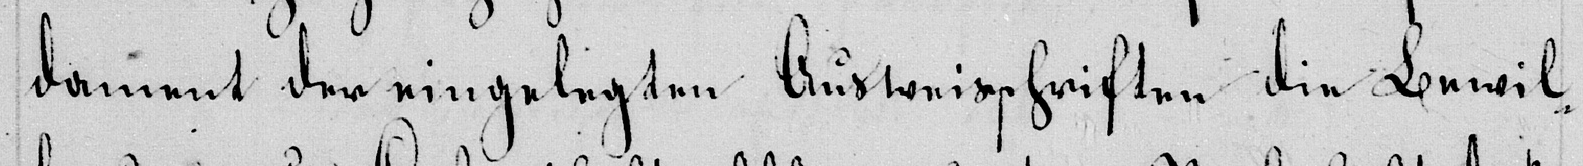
dament der eingelegten Ausweisschriften die Bewil¬
